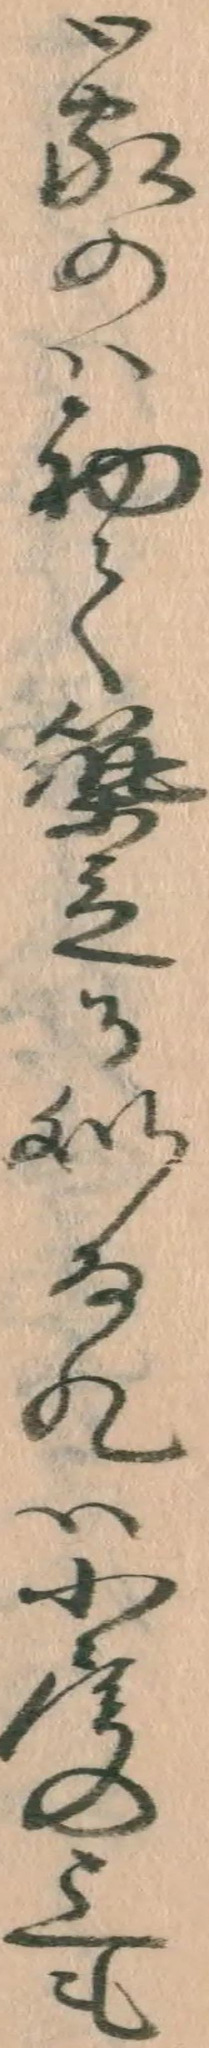御家のハ初て築立る処なれハ小屋の上も
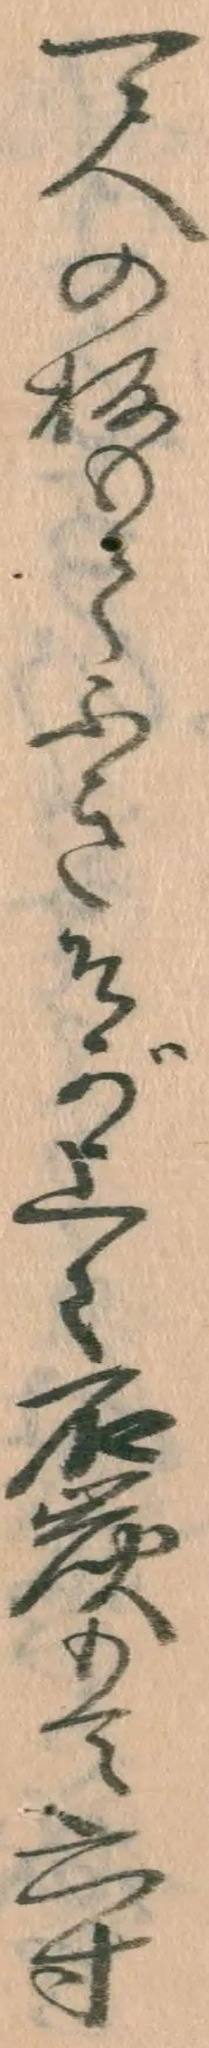一尺の板もてふきそが上に石炭もて六寸
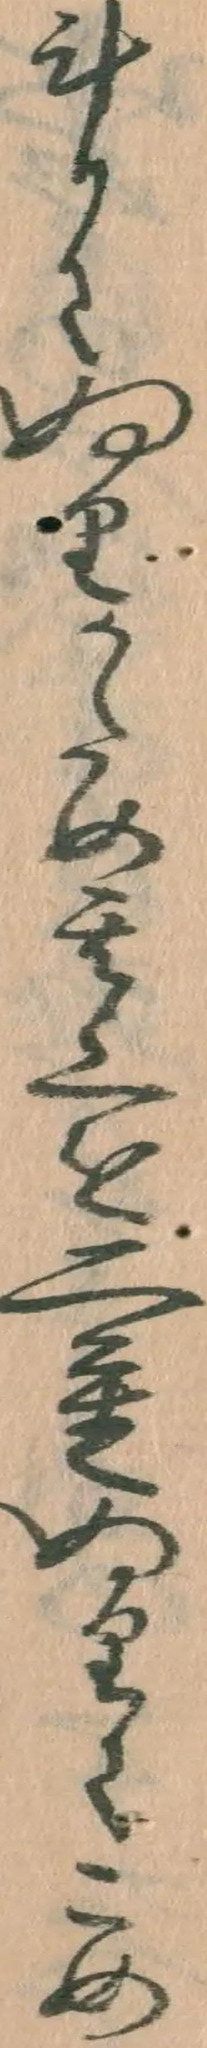斗にてぬりかため其上を二重ぬりにこめ
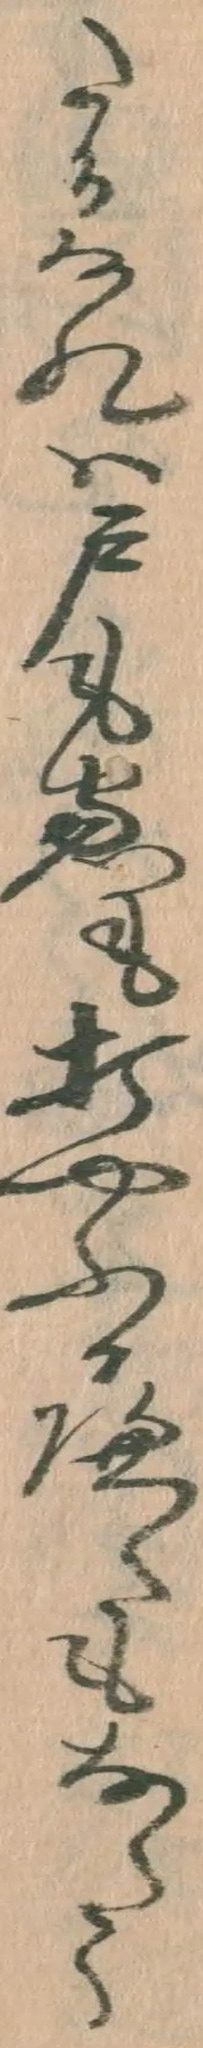たるなれハ戸も窓も打やふるへくもなくて
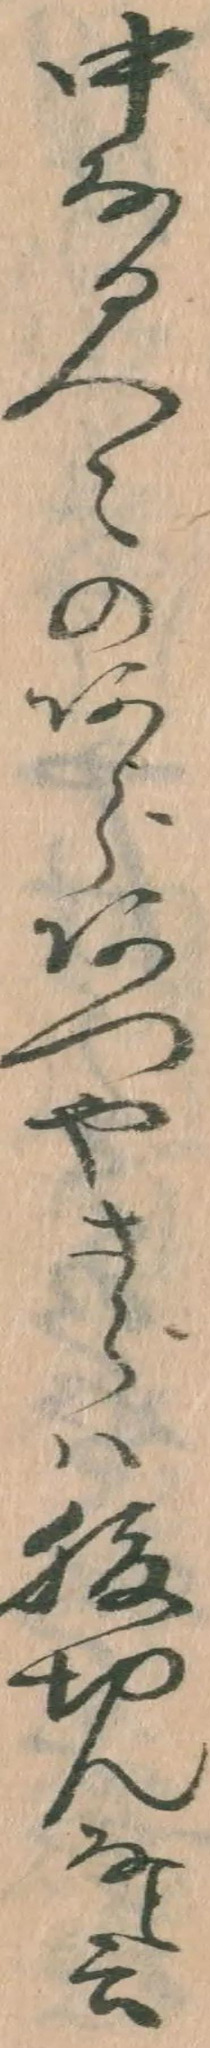中なる人々のあらあつやさらハ腹切んなと云
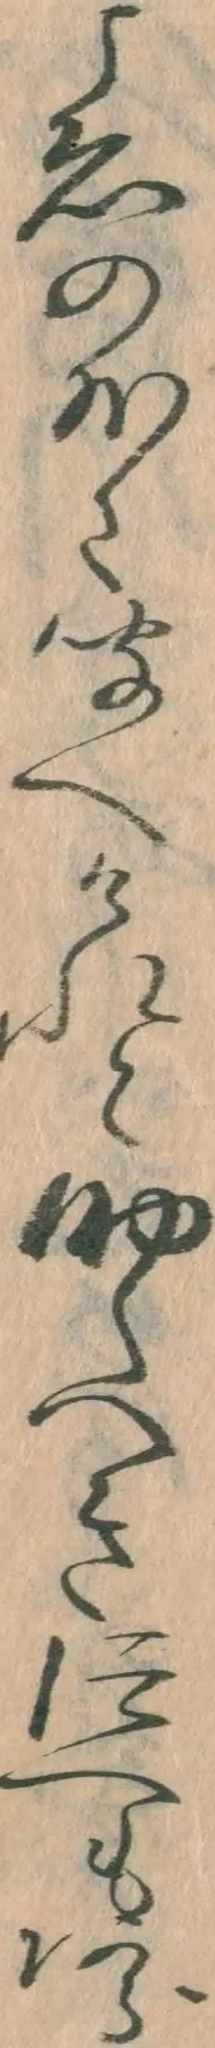こゑの外に聞へけれと助くへきすへもあら
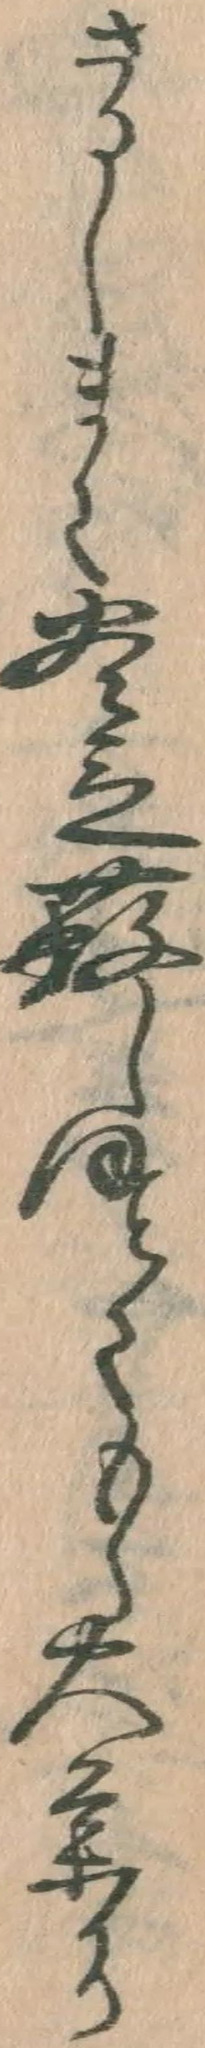さるしまに炎立藪しほとにもし火薬に
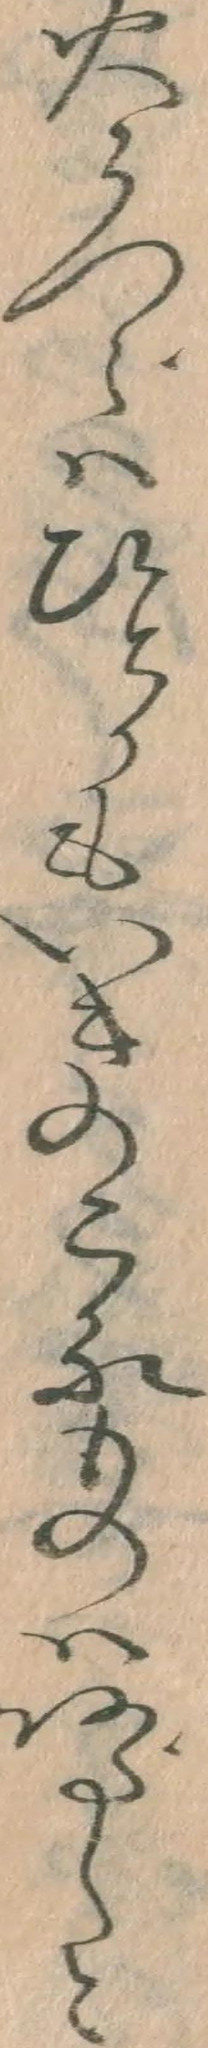火うつらハひとりもいきのこるものハあらしと
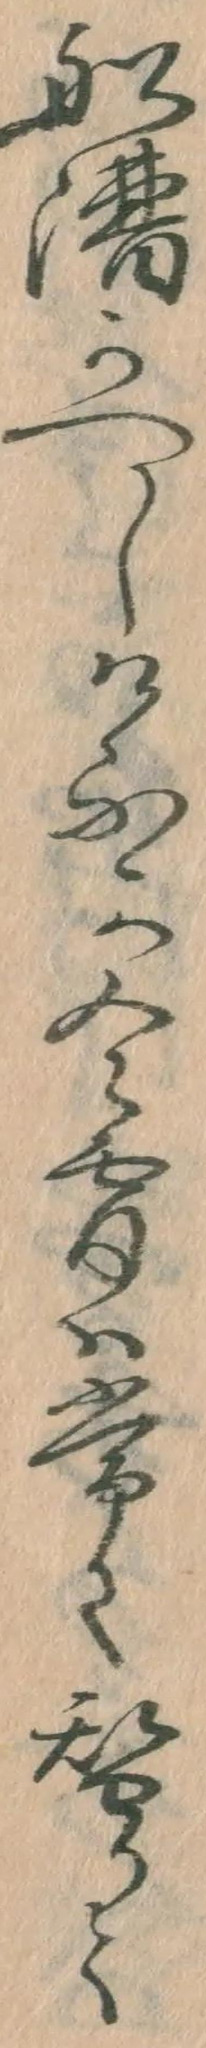船漕かへしけるか今宵ハ常に替りて
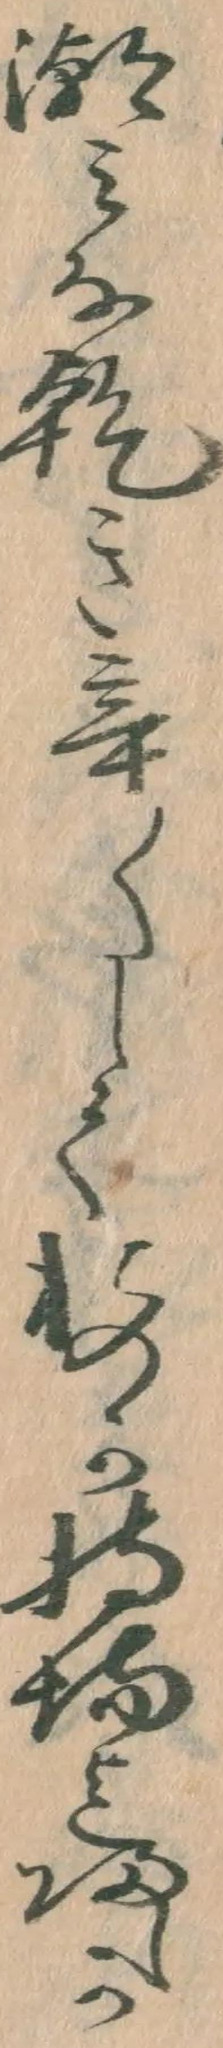潮ミな乾き辛くしておのか持場迄帰しか
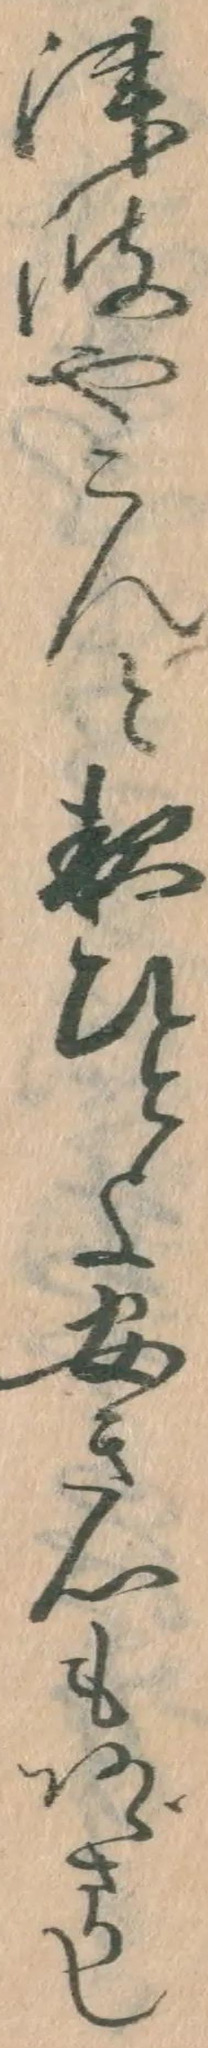津波やこんと夜ひとよ安き心もあらさりし
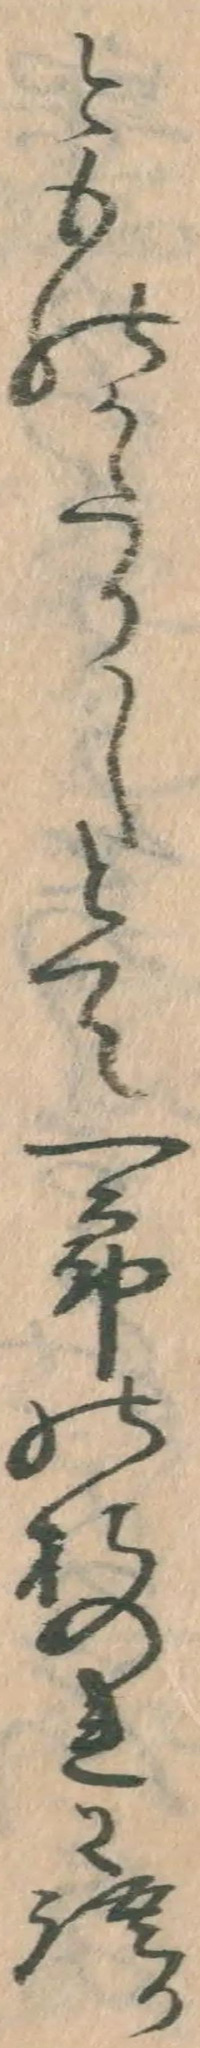とものかたりしとて一郎のおのれに語り
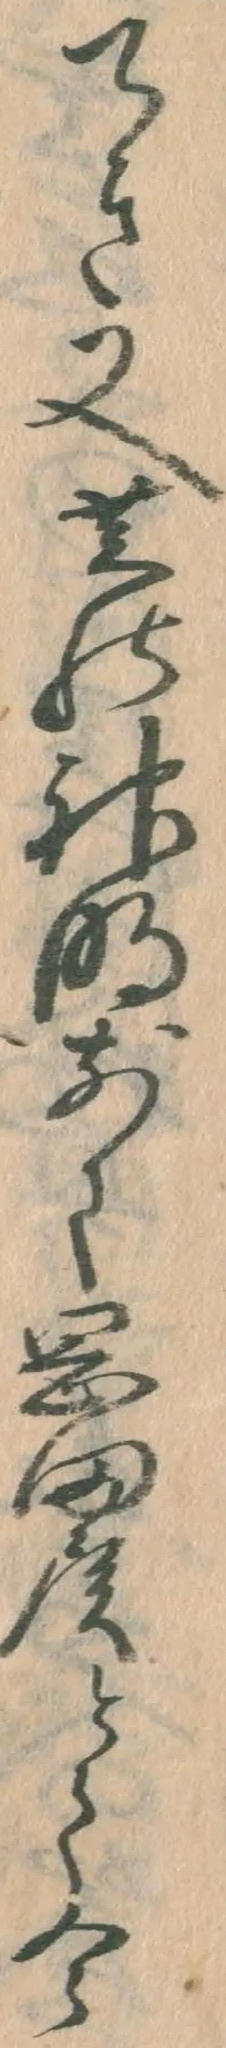候き又芝の神明前に岡田屋とて今
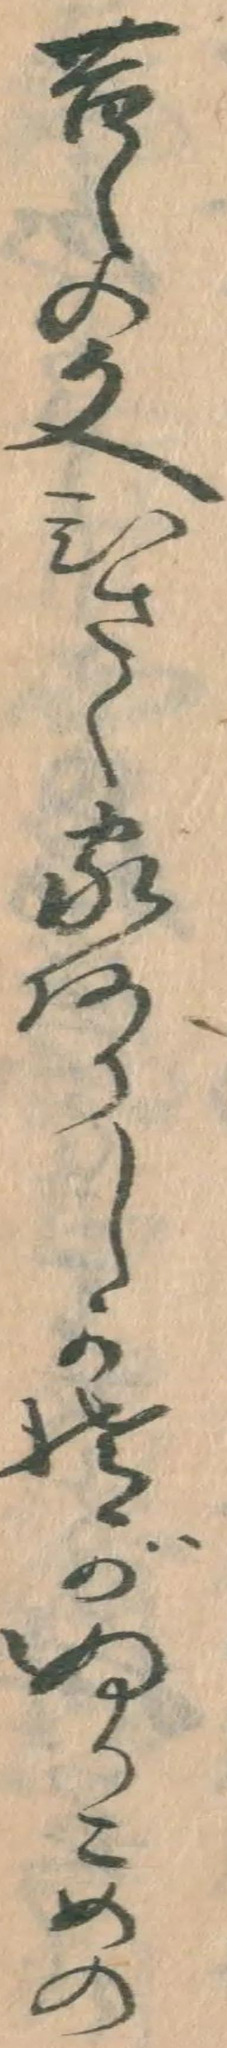昔しの文ひさく家ありしかそがぬりこめの

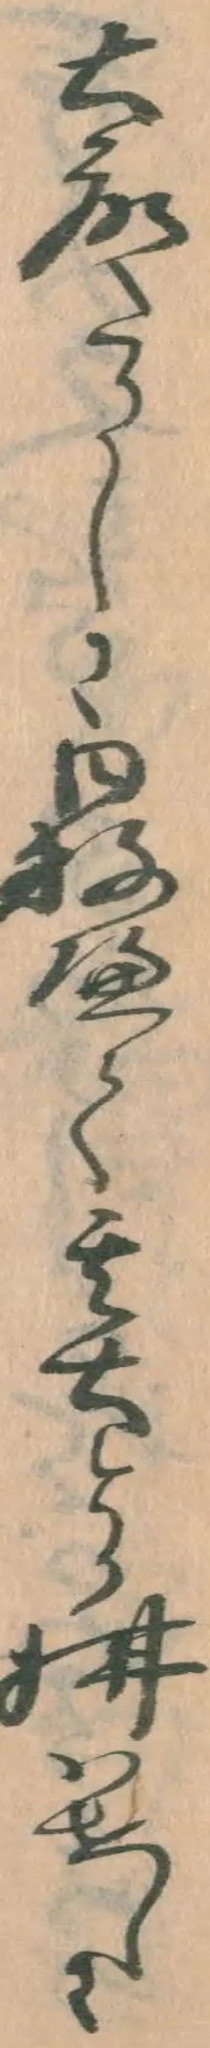土屏たりしに日数へて其土とり拂ハせしに
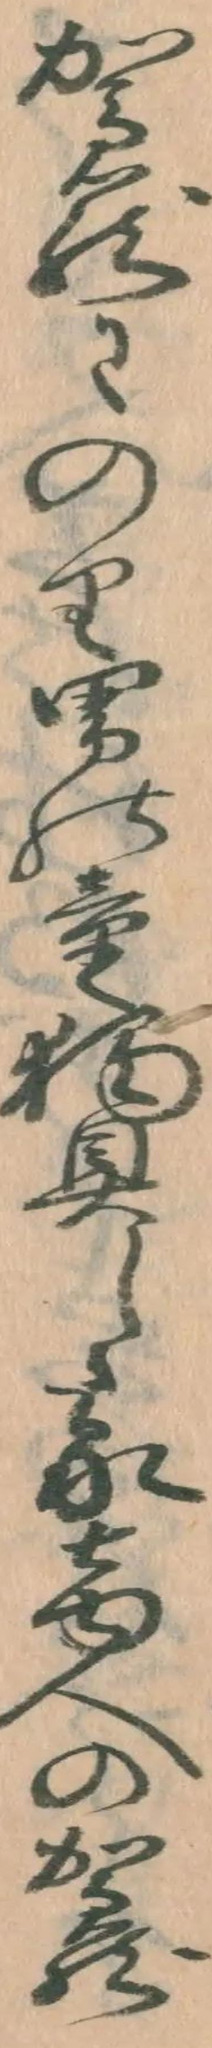駕籠にのり男の童獨具したる商人の駕籠
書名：麗斎叢書. 20
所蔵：国立国会図書館 National Diet Library, JAPAN
